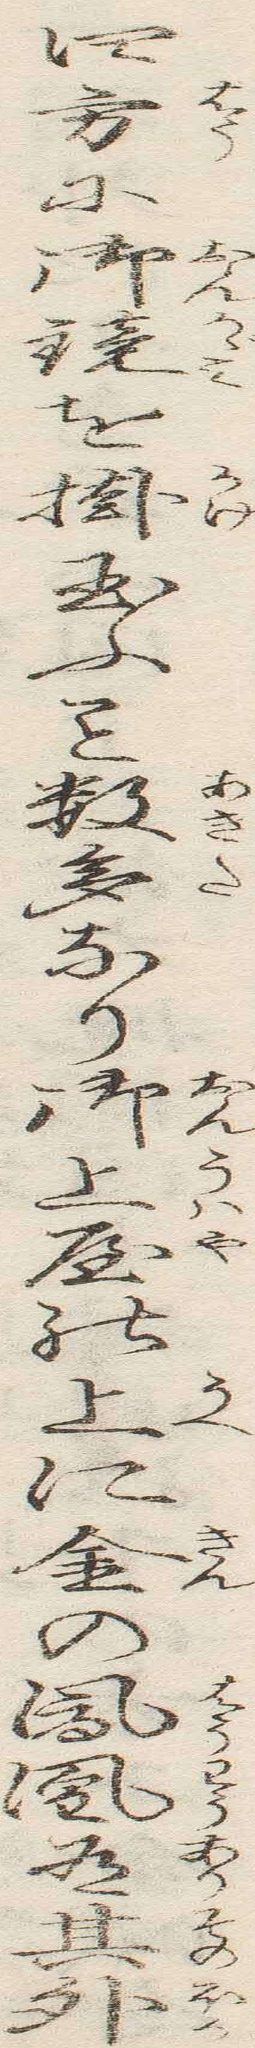四方に御鏡を掛玉ふこと数多なり御上屋の上に金の鳳凰有其外
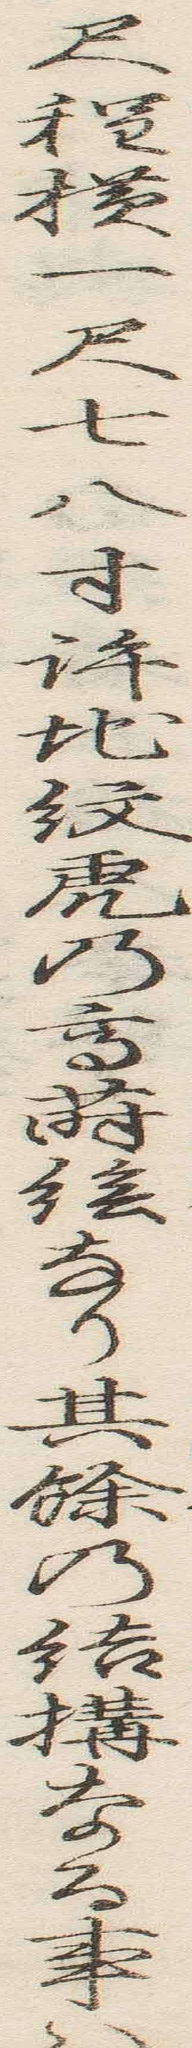尺程横一尺七八寸許地紋虎の高莳繪なり其餘の結搆なる事は
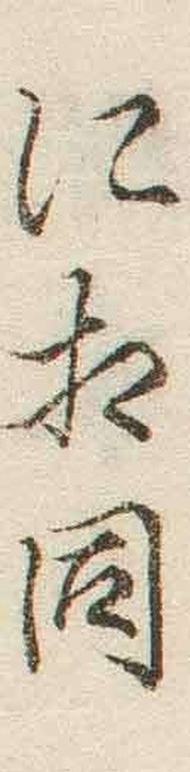に相同

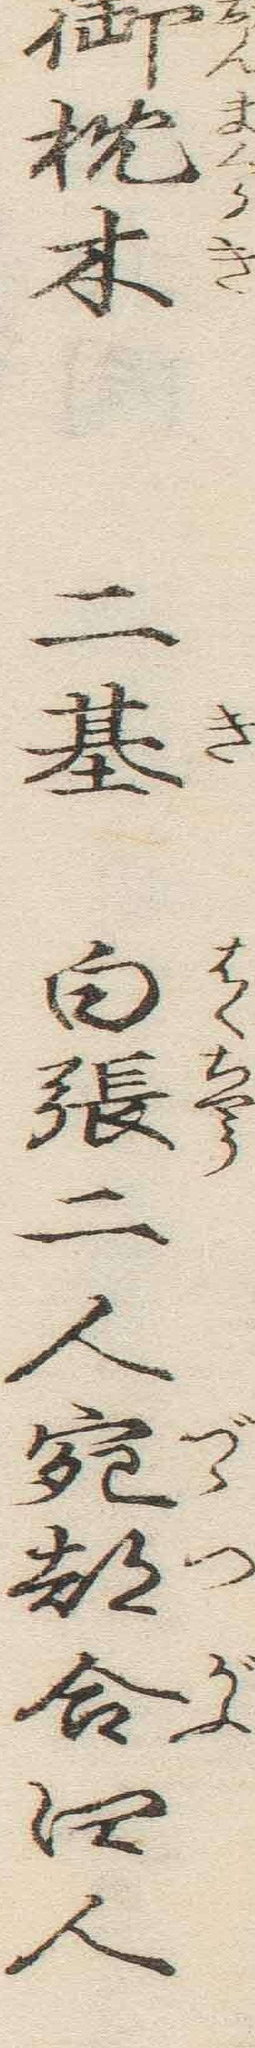御枕木二基白張二人宛都合四人
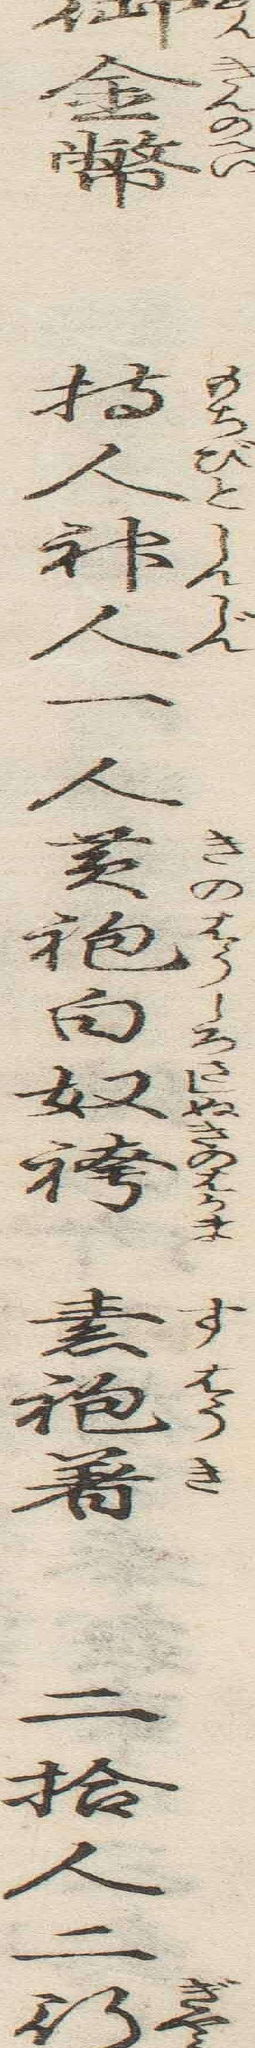御金幣持人神人一人黄袍白奴袴素袍着二拾人二行
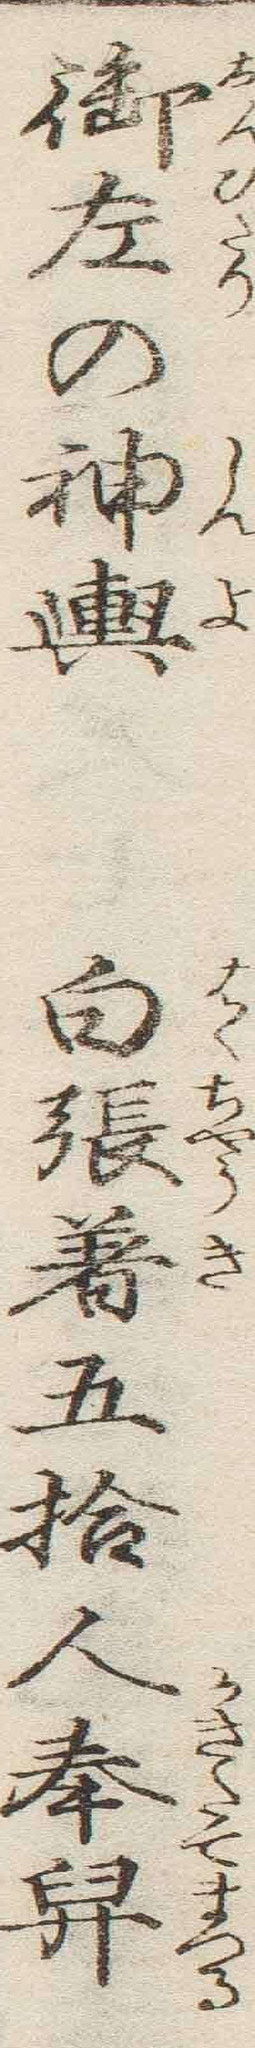御左の神輿白張着五拾人奉舁
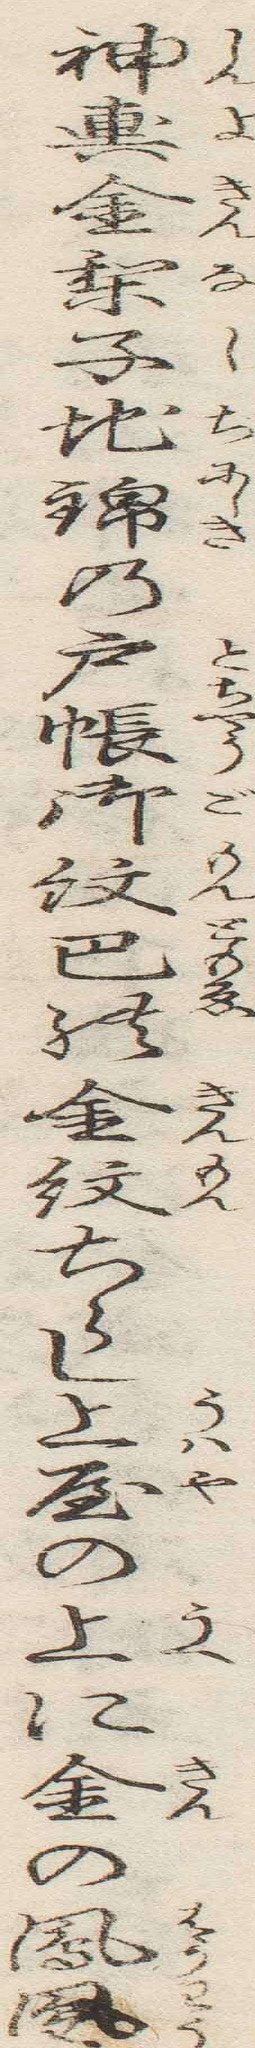神輿金梨子地錦の戸帳御紋巴の金紋ちらし上屋の上に金の鳳凰
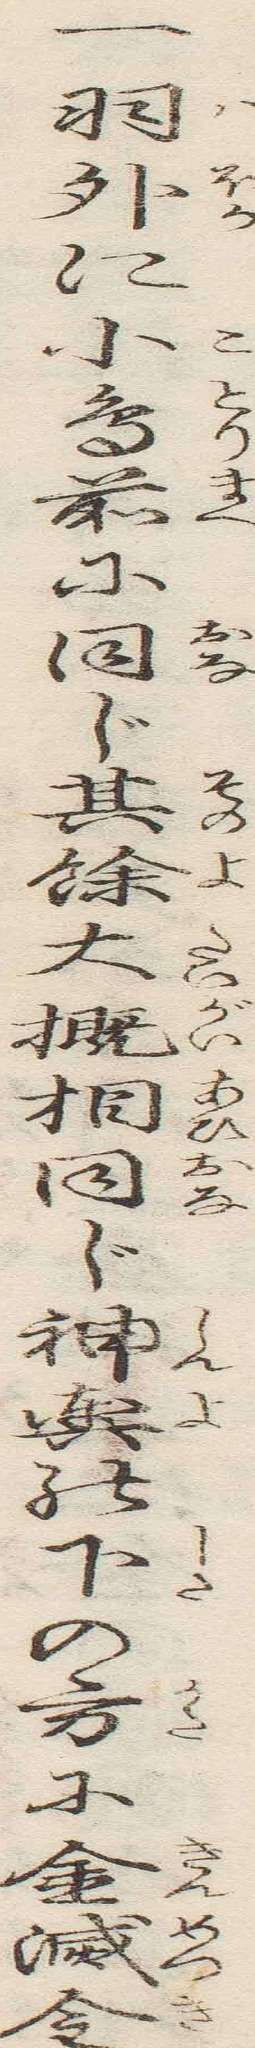一羽外に小鳥前に同じ其餘大概相同じ神輿の下の方に金滅金
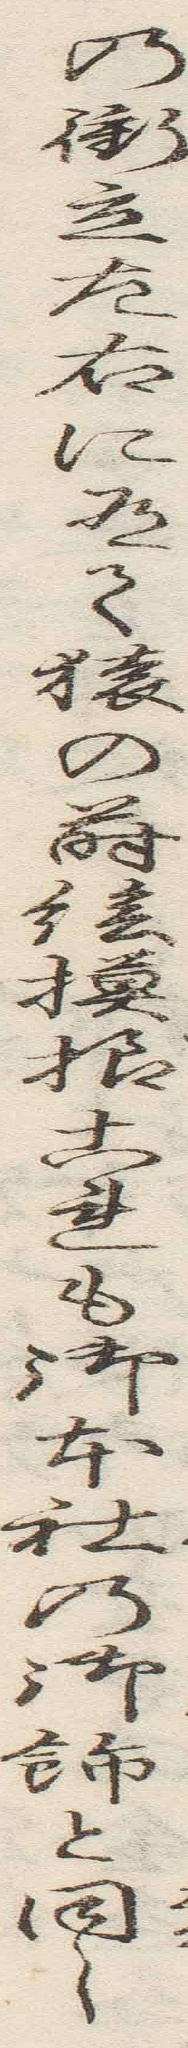の衝立左右に有て猿の莳繪摸様これも御本社の御飾と同し
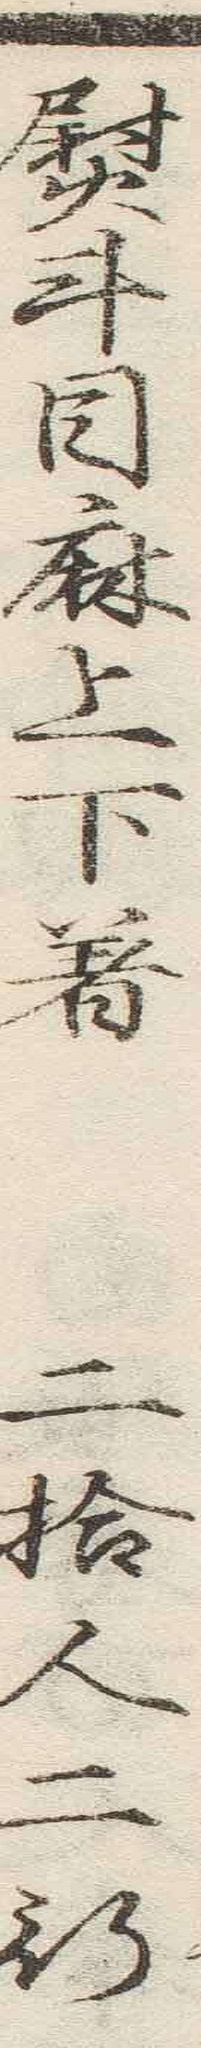熨斗目麻上下着二拾人二行
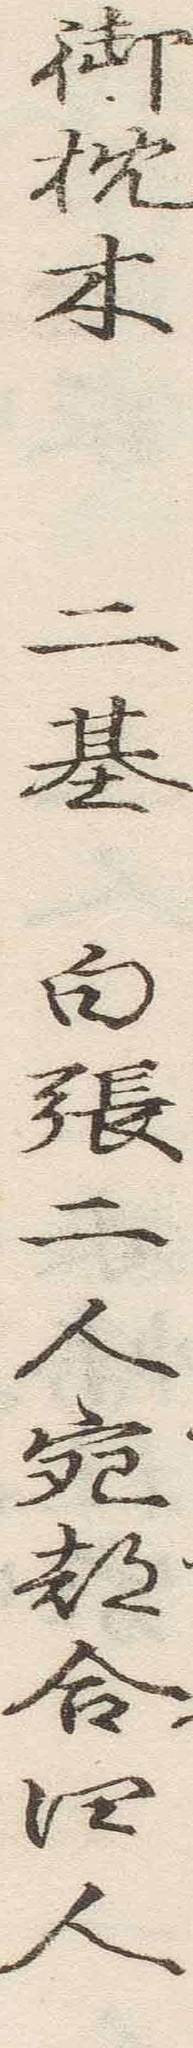御枕木二基白張二人宛都合四人
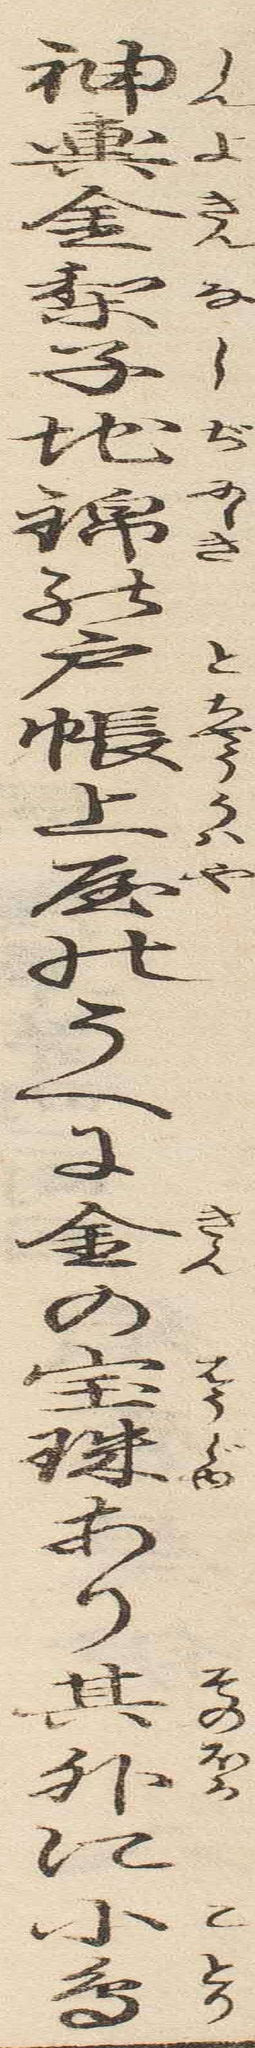神輿金梨子地錦の戸帳上屋のうへに金の宝珠あり其外に小鳥
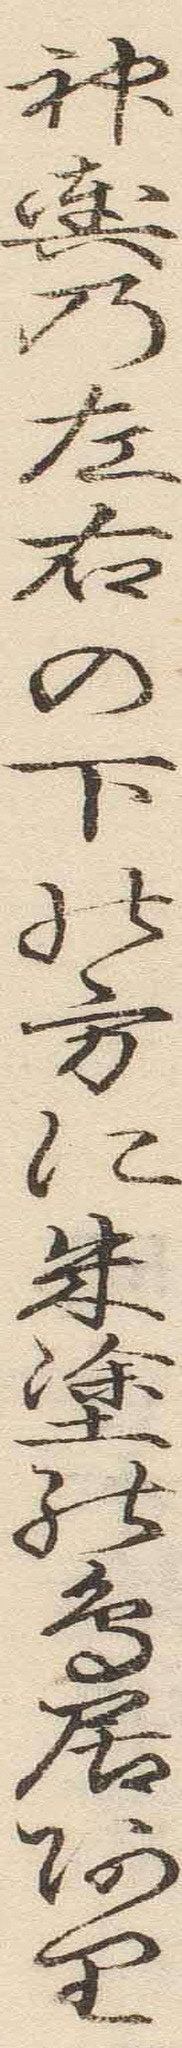神輿の左右の下の方に朱塗の鳥居あり
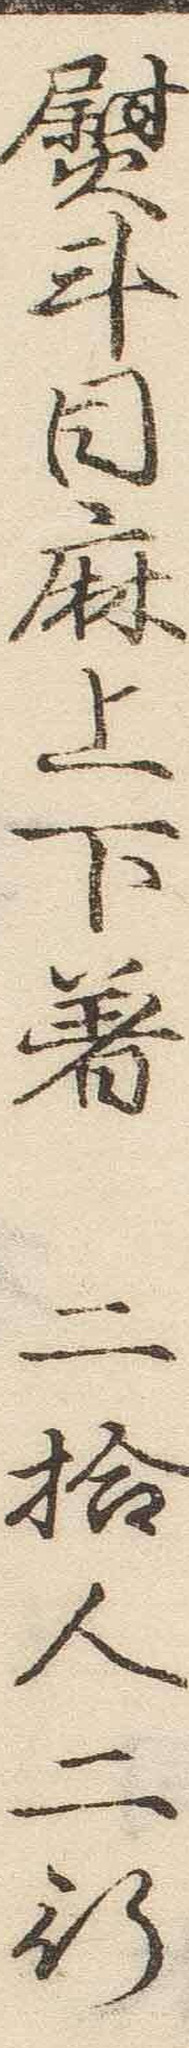熨斗目麻上下着二拾人二行
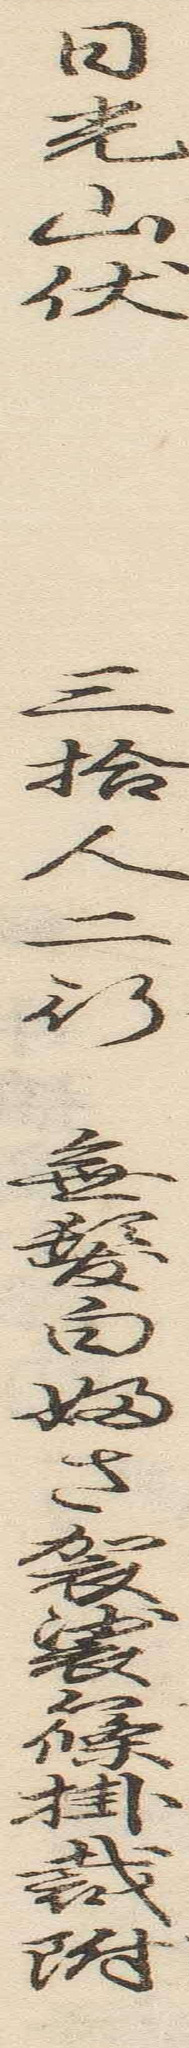日光山伏三拾人二行無髪白ふさ袈裟篠掛裁附
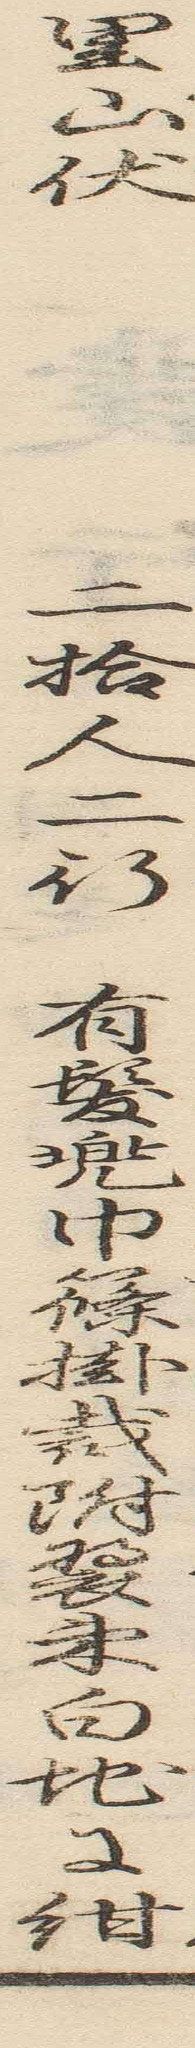里山伏二拾人二行有髪兠巾篠掛裁附装束白地に紺
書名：日光山志
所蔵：東京学芸大学附属図書館 国文学研究資料館
